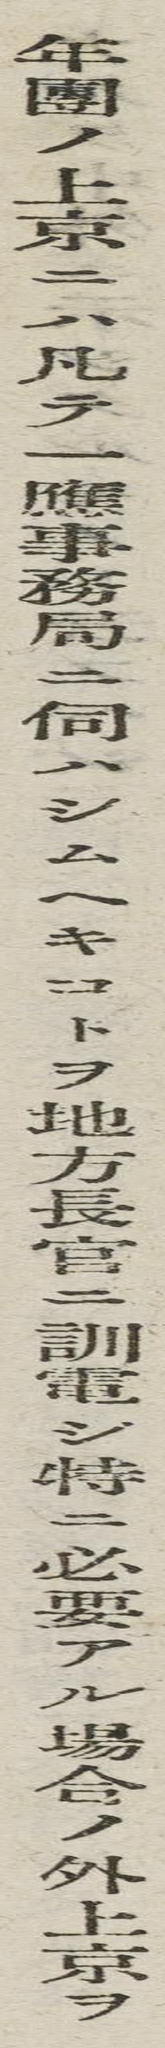年団ノ上京ニハ凡テ一応事務局ニ伺ハシムヘキコトヲ地方長官ニ訓電シ特ニ必要アル場合ノ外上京ヲ
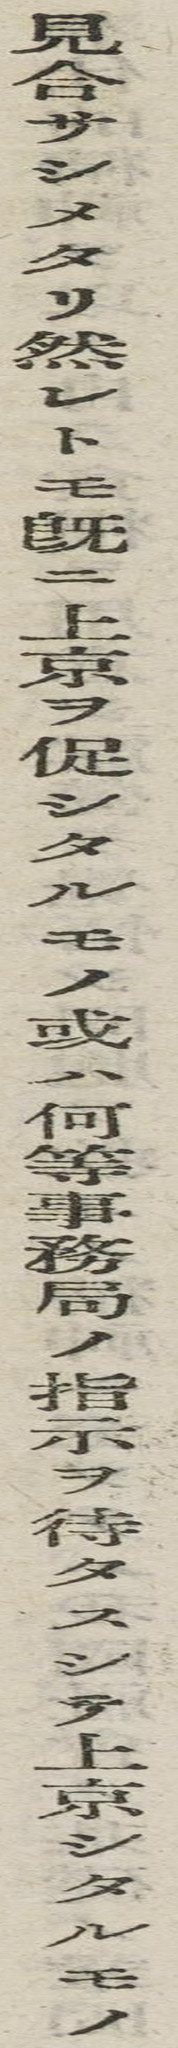見合サシメタリ然レトモ既ニ上京ヲ促シタルモノ或ハ何等事務局ノ指示ヲ待タスシテ上京シタルモノ
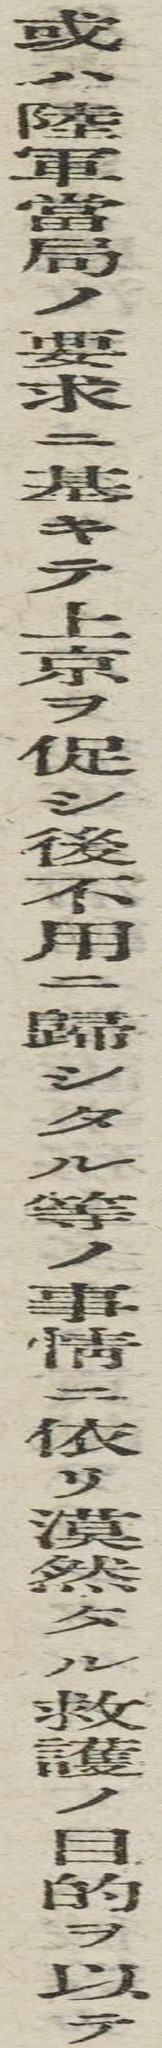或ハ陸軍当局ノ要求ニ基キテ上京ヲ促シ後不用ニ帰シタル等ノ事情ニ依リ漠然タル救護ノ目的ヲ以テ
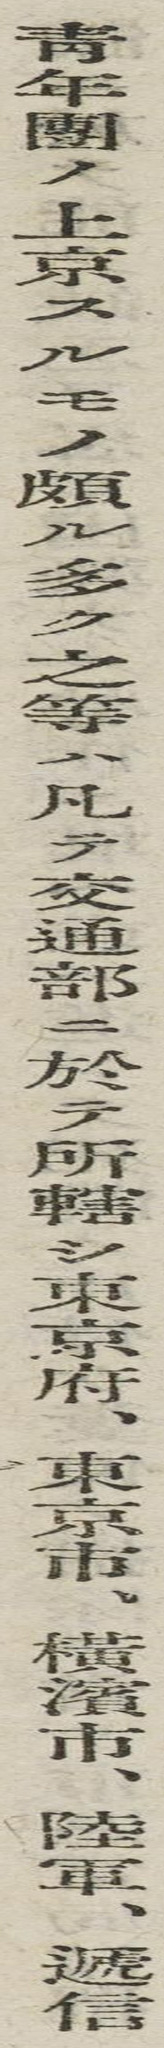青年団ノ上京スルモノ頗ル多ク之等ハ凡テ交通部ニ於テ所轄シ東京府、東京市、横浜市、陸軍、逓信
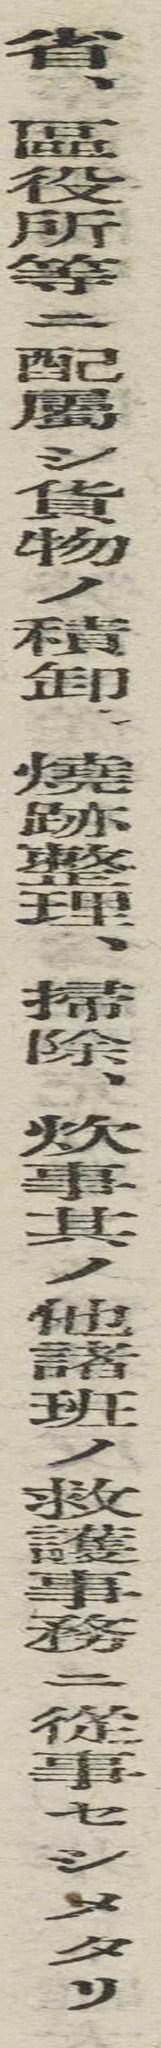省、区役所等ニ配属シ貨物ノ積卸、焼跡整理、掃除、炊事其ノ他諸班ノ救護事務ニ従事セシメタリ

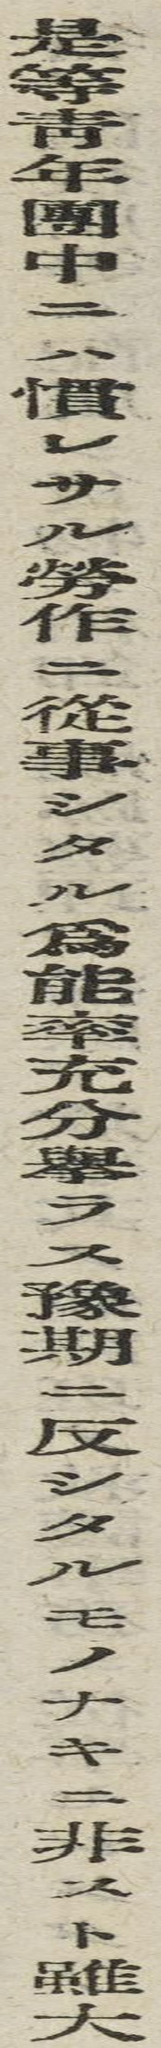是等青年団中ニハ慣レサル労作ニ従事シタル為能率充分挙ラス予期ニ反シタルモノナキニ非スト雖大
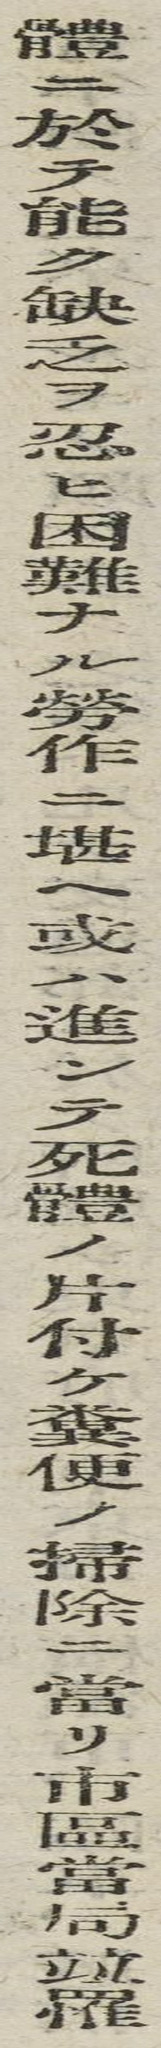体ニ於テ能ク欠乏ヲ忍ヒ困難ナル労作ニ堪ヘ或ハ進シテ死体ノ片付ケ糞便ノ掃除ニ当リ市区当局並罹
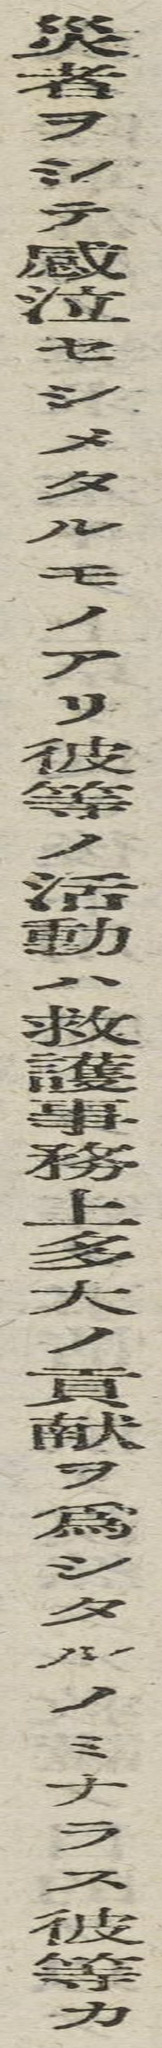災者ヲシテ感泣セシメタルモノアリ彼等ノ活動ハ救護事務上多大ノ貢献ヲ為シタルノミナラス彼等カ
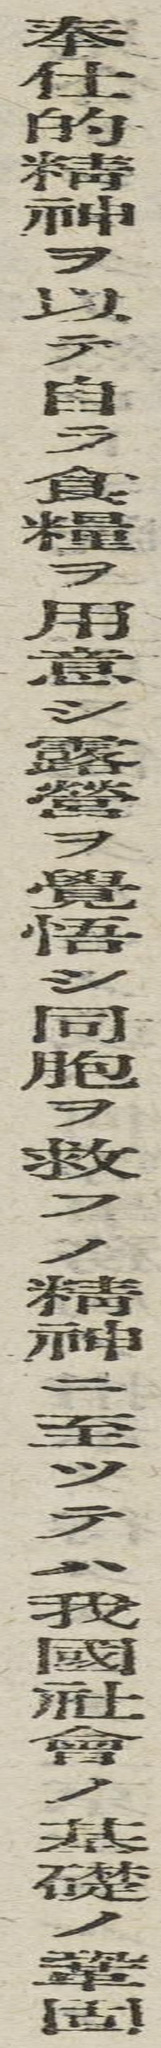奉仕的精神ヲ以テ自ラ食糧ヲ用意シ露営ヲ覚悟シ同胞ヲ救フノ精神ニ至ツテハ我国社会ノ基礎ノ革固
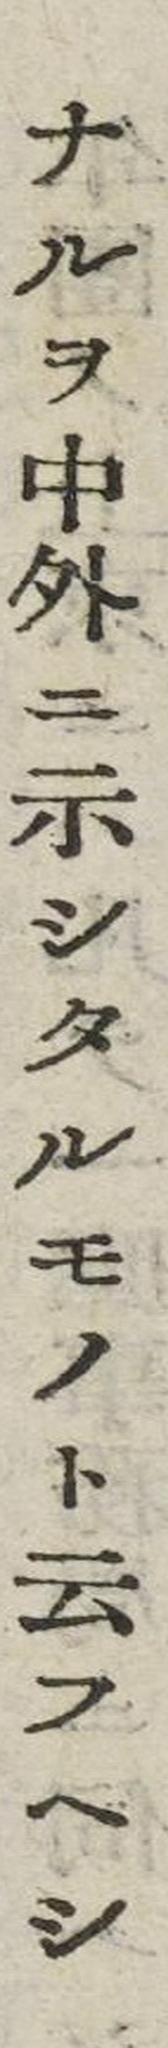ナルヲ中外ニ示シタルモノト云フヘシ
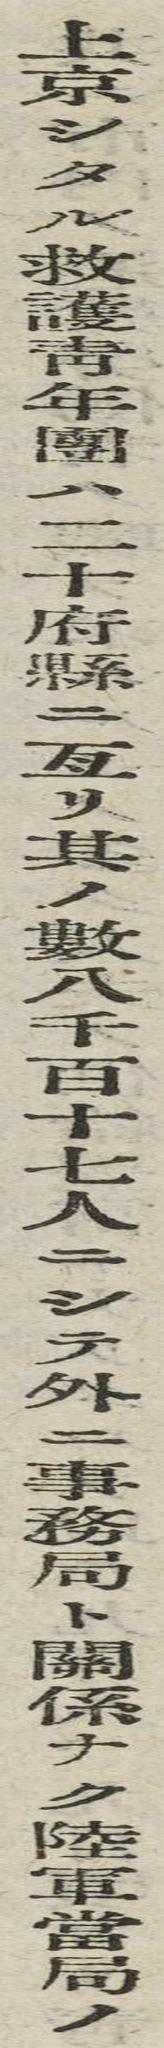上京シタル救護青年団ハ二十府県ニ亙リ其ノ数八千百十七人ニシテ外ニ事務局ト関係ナク陸軍当局ノ
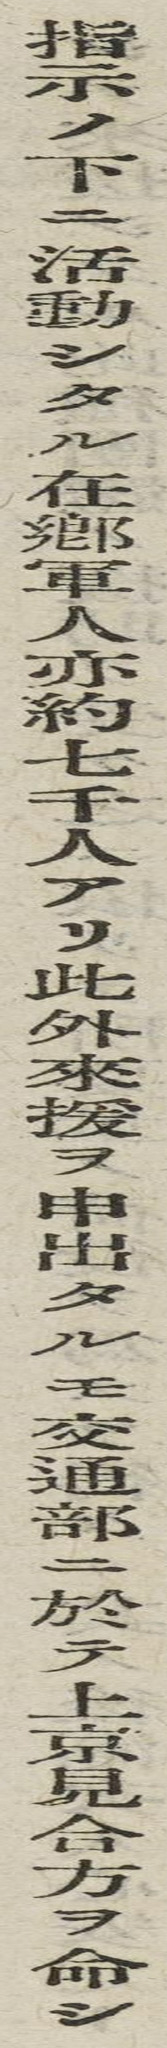指示ノ下ニ活動シタル在郷軍人亦約七千人アリ此外来援ヲ申出タルモ交通部ニ於テ状況見合方ヲ命シ
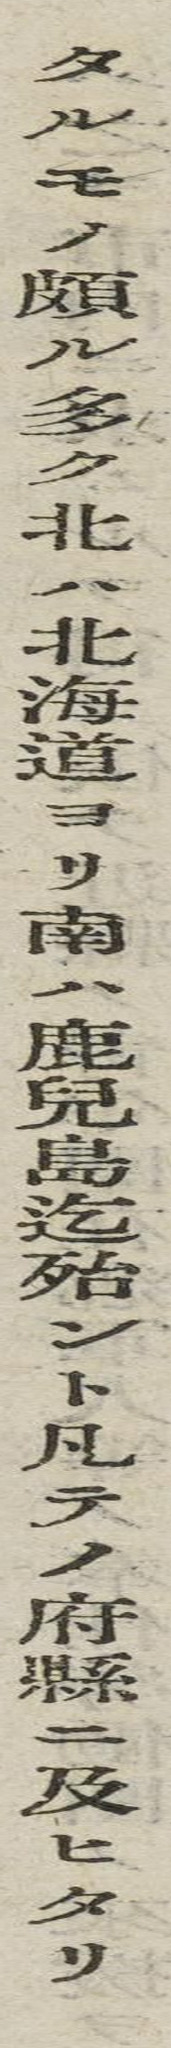タルモノ頗ル多ク北ハ北海道ヨリ南ハ鹿児島迄殆ント凡テノ府県ニ及ヒタリ
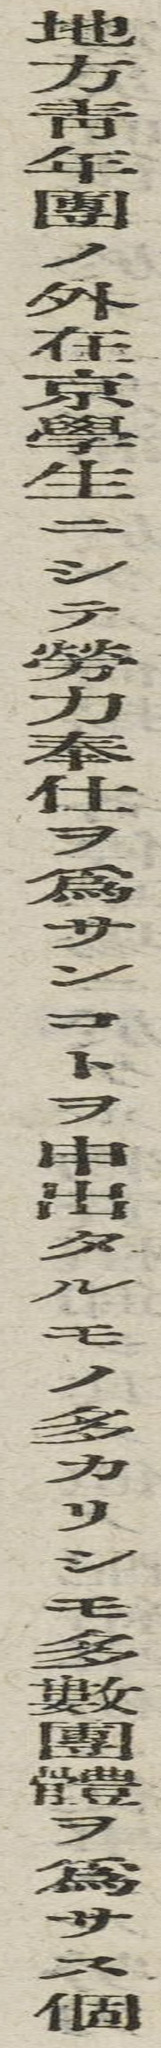地方青年団ノ外在京学生ニシテ労力奉仕ヲ為サンコトヲ申出タルモノ多カリシモ多数団体ヲ為サス個
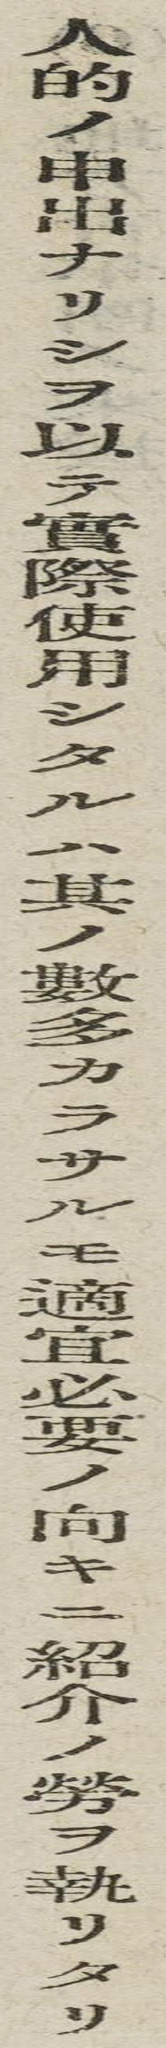人的ノ申出ナリシヲ以テ実際使用シタルハ其ノ数多カラサルモ適宜必要ノ向キニ紹介ノ労ヲ執リタリ
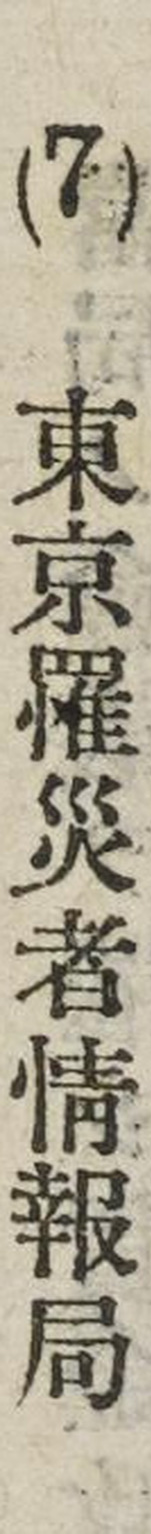⑺東京罹災者情報局
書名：震災被害状況並救護施設概要
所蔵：東京大学地震研究所図書室 Earthquake Research Institute Library, The University of Tokyo, JAPAN
